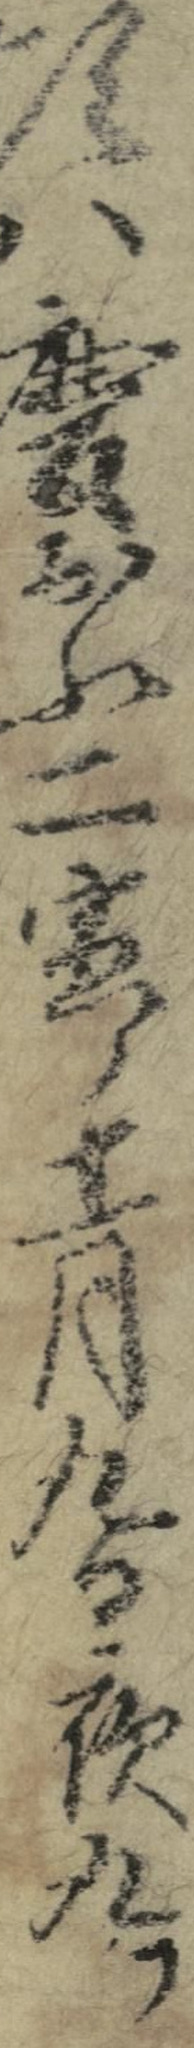頃ハ慶おふ二寅ノ十一月九日夜九ッ
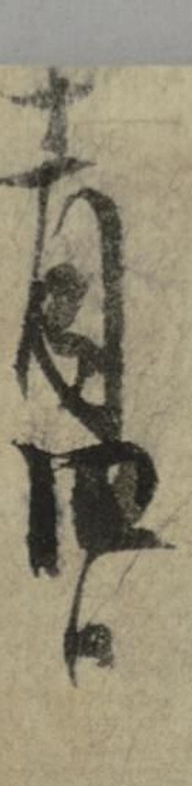十一月四日
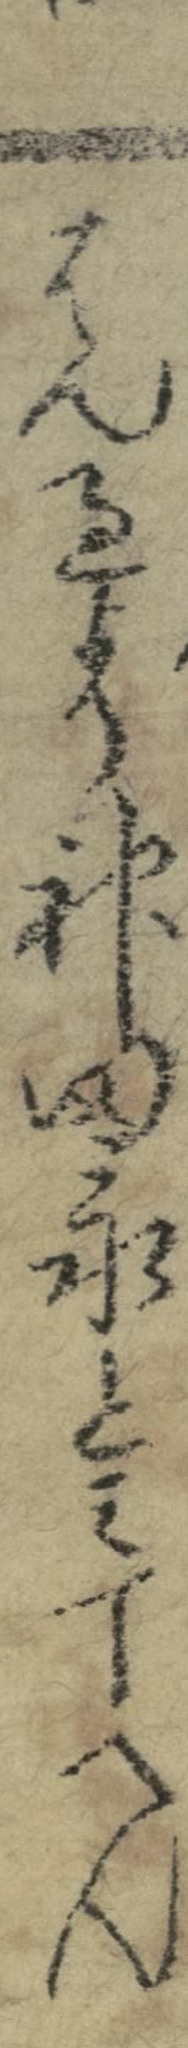はん過より神田永とミ丁へん
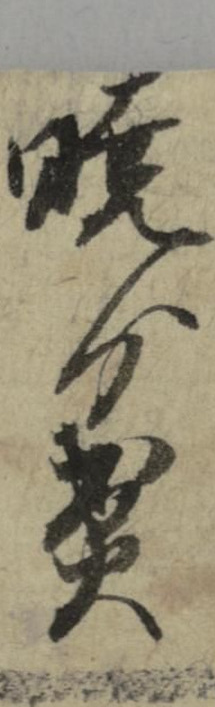暁ゟ出火
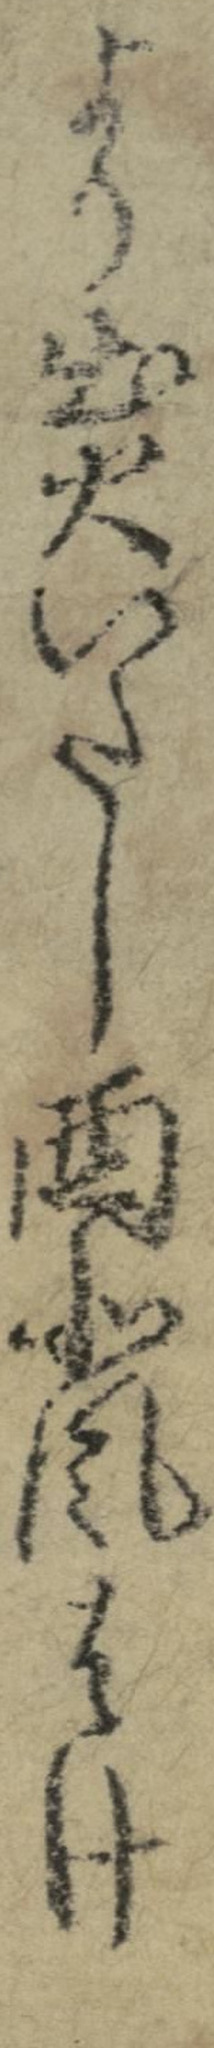より出火いたし西北風はけ
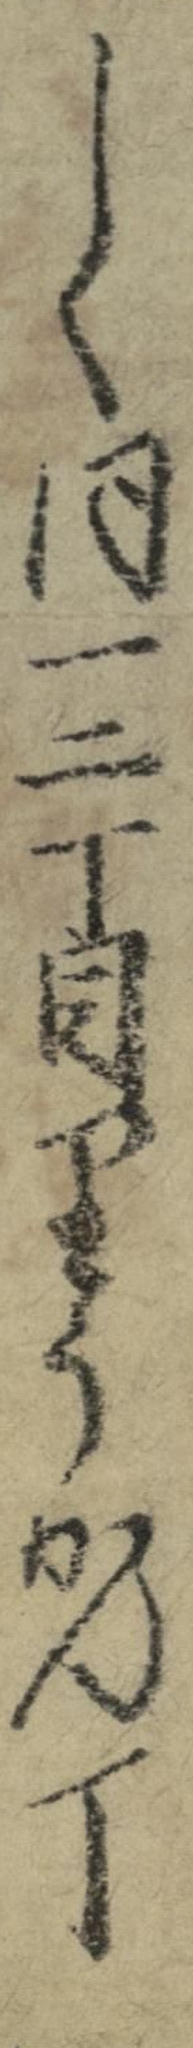しく同一二丁目りうかん丁
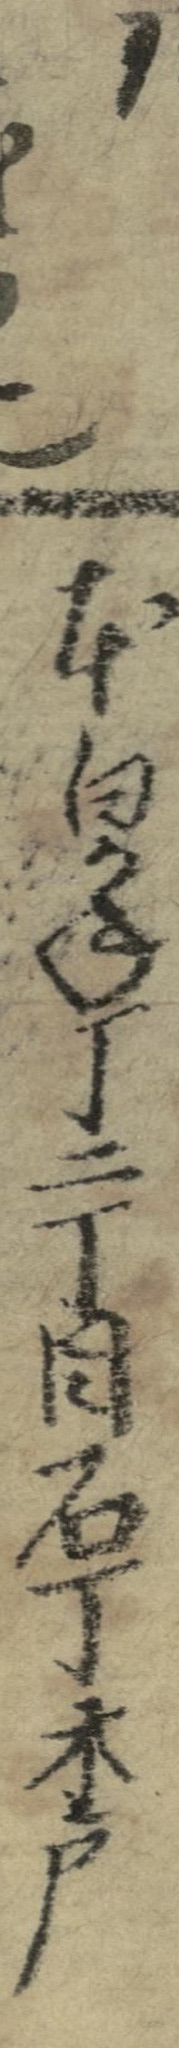本白かね丁二丁目石丁木戸
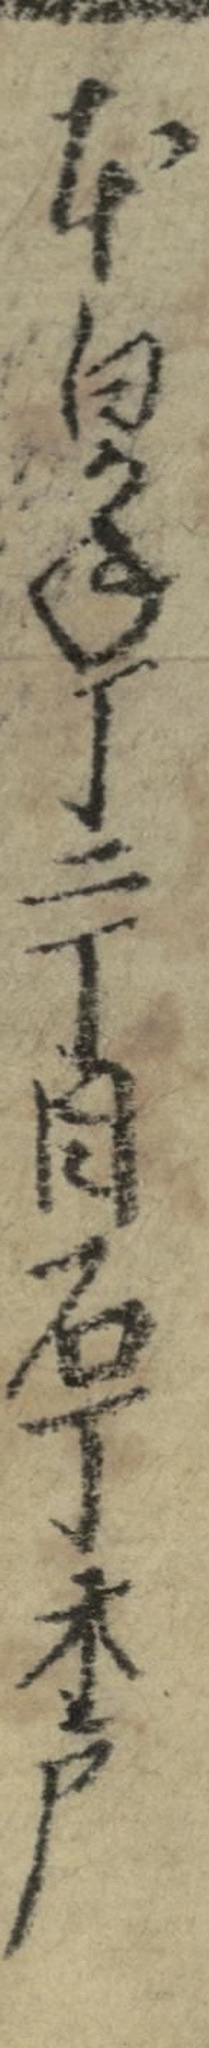本白かね丁二丁目石丁木戸
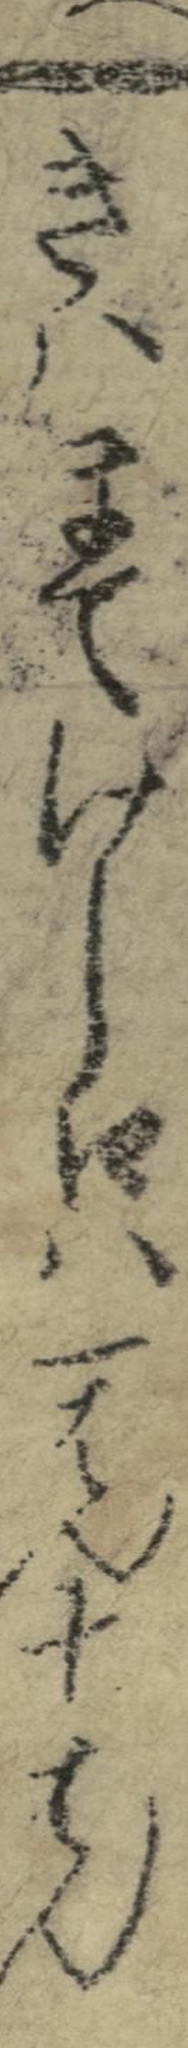きハまてけし口ハ一はん十はん
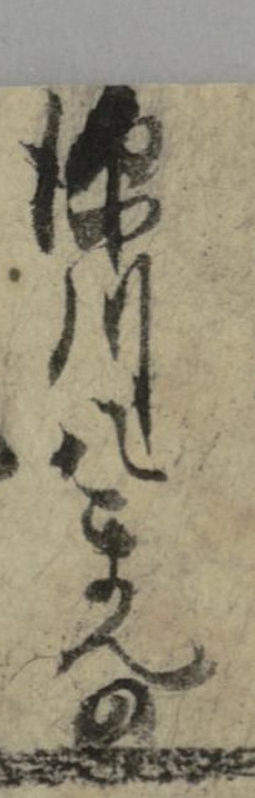深川八まんの
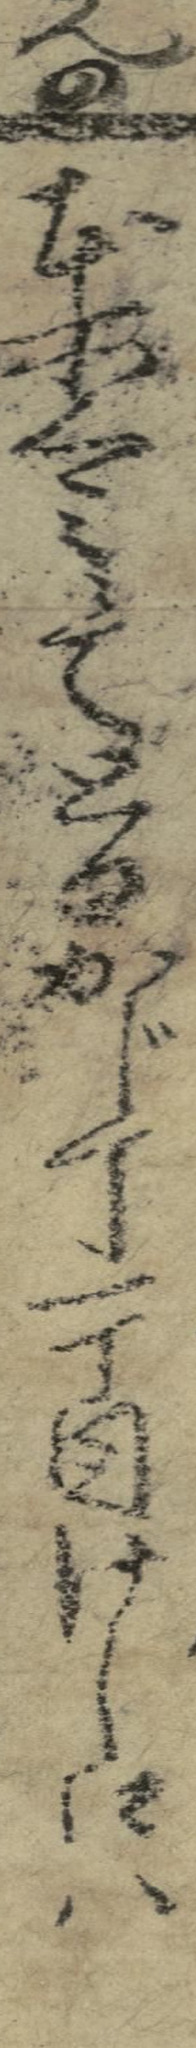本所くミてとるかじ丁一丁目けし口ハ
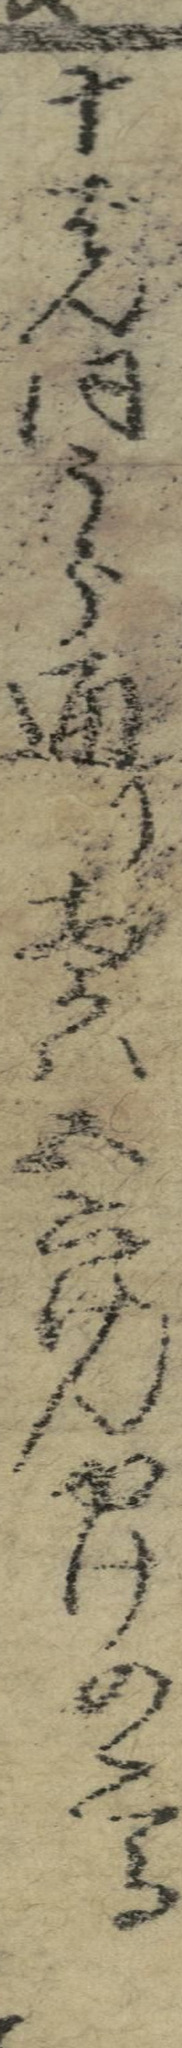十ばん同うら通り兩かハ五六けんやけのこる
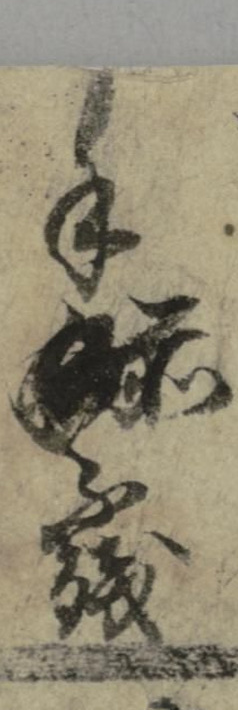手前不残
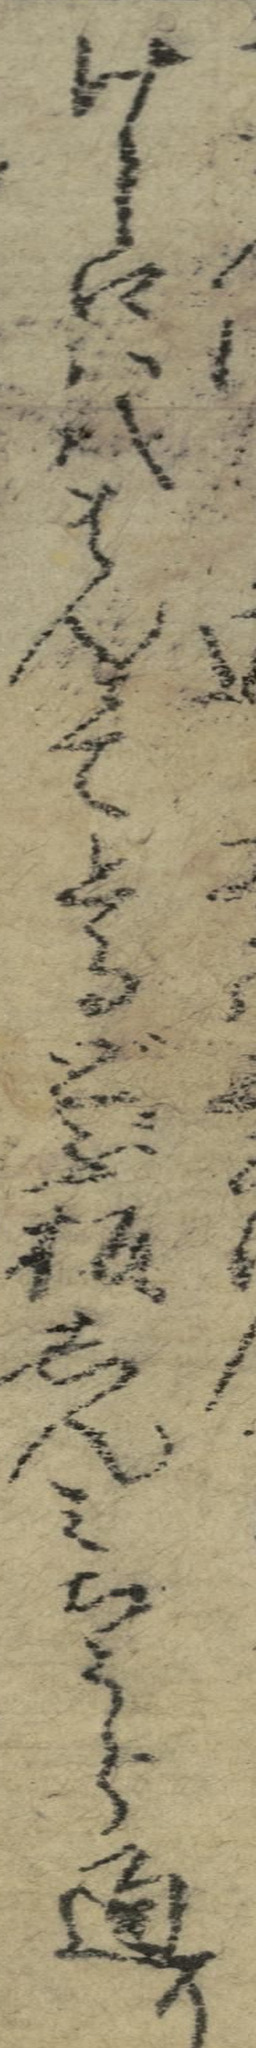けし口ハ八はん二てとるどぶ板しんミちうら通り
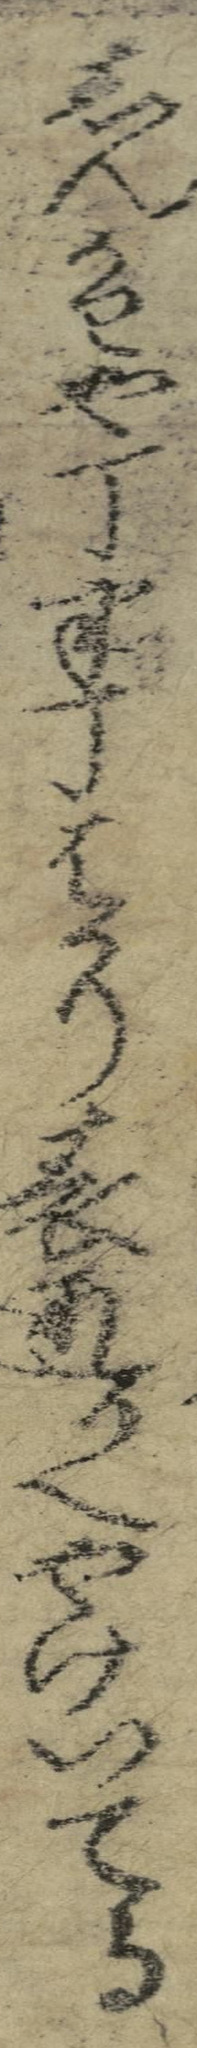しんかわや丁半丁はかり表通りへやけいてる
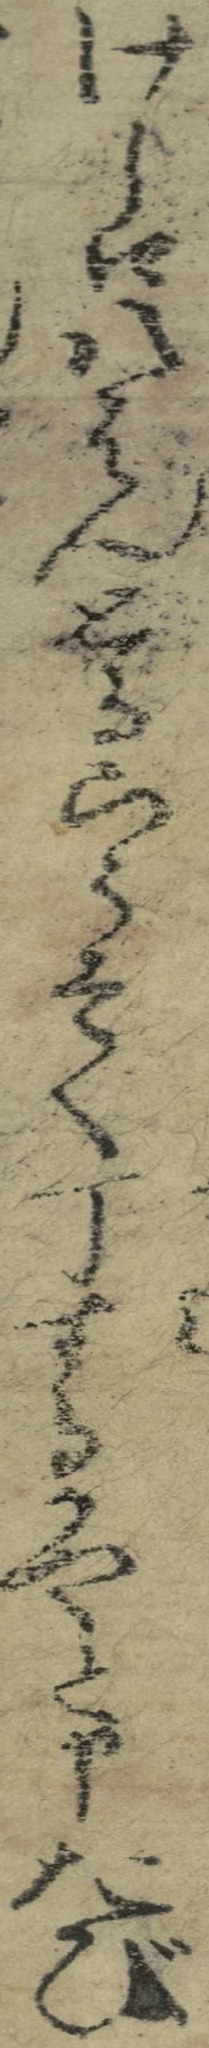けし口八はんとるらうそく丁するかやと申たび
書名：[慶応二年十一月の江戸大火に関する瓦版]
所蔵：東京大学地震研究所図書室 Earthquake Research Institute Library, The University of Tokyo, JAPAN
